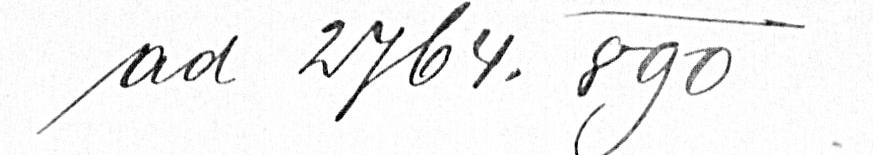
ad 2764. 890
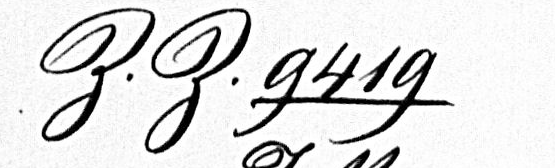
Z.Z. 9419
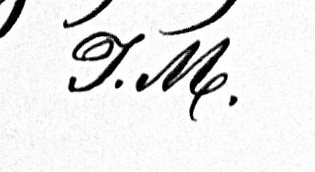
/T.M.
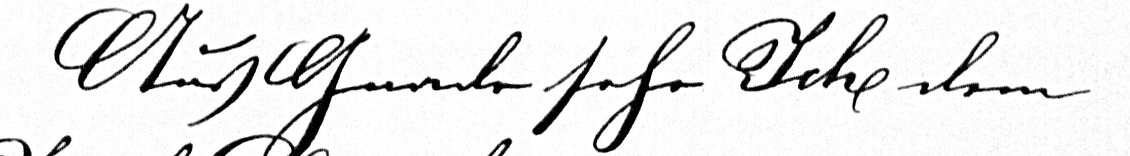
Aus Gnade sehr Ich dem
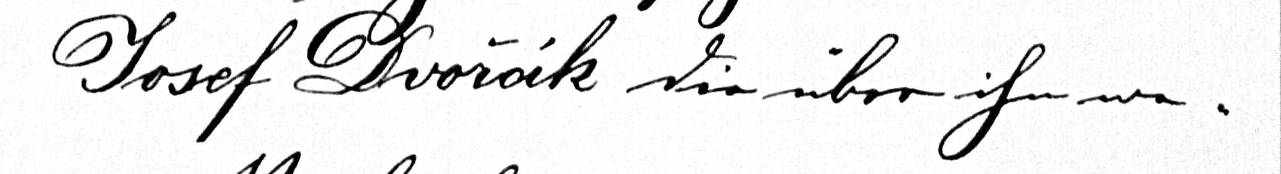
Josef Dvořák die über ihn we¬
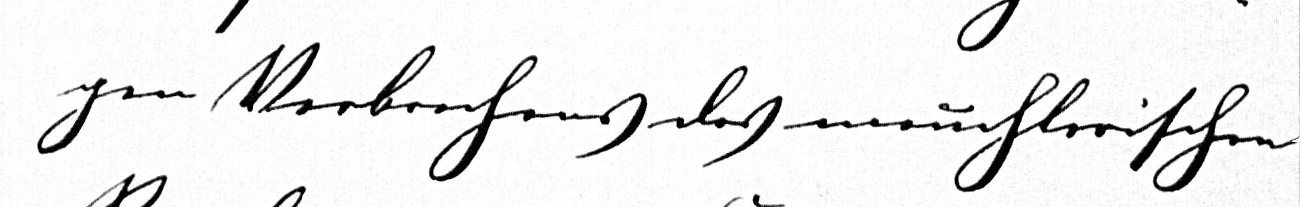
gen Verbrechens des meuchlerischen
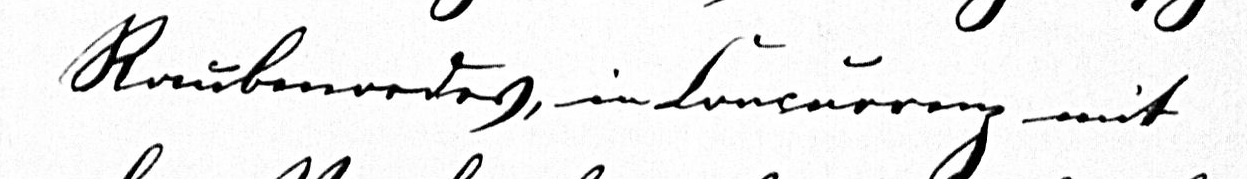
Raubmordes, in Concurrenz mit
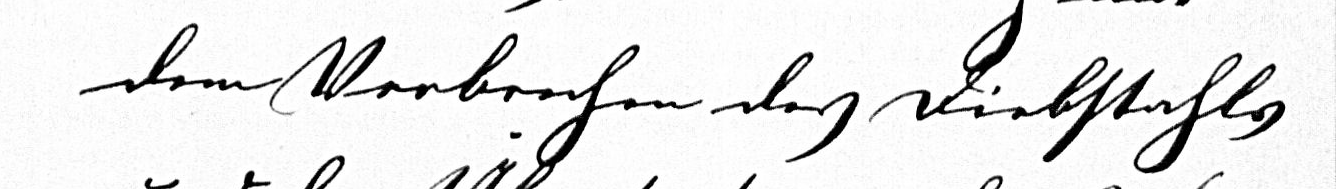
dem Verbrechen des Diebstahls
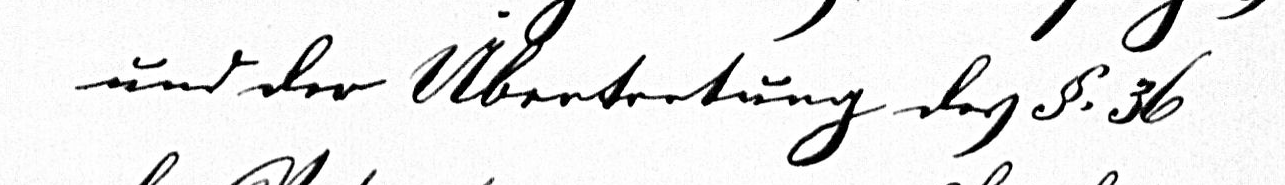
und der Übertretung des §. 36
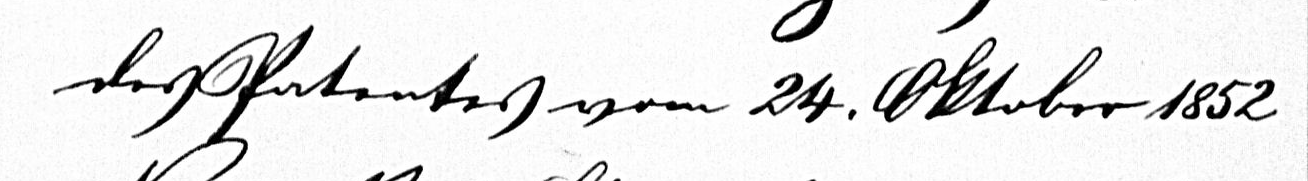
des Patentes vom 24. Oktober 1852
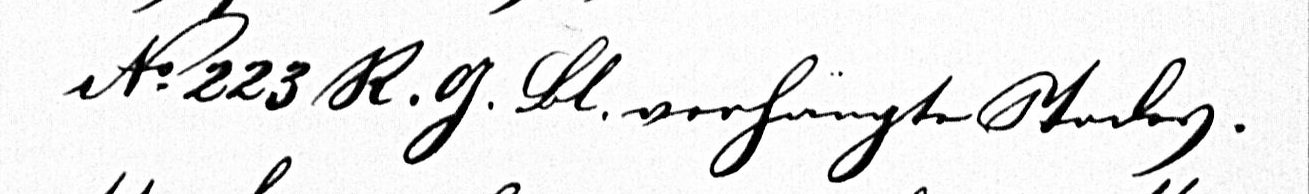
N° 223 R. G. Bl. verhängte Todes¬
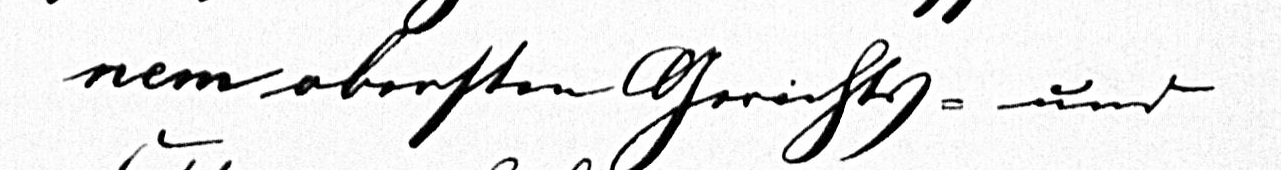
nem obersten Gerichts= und
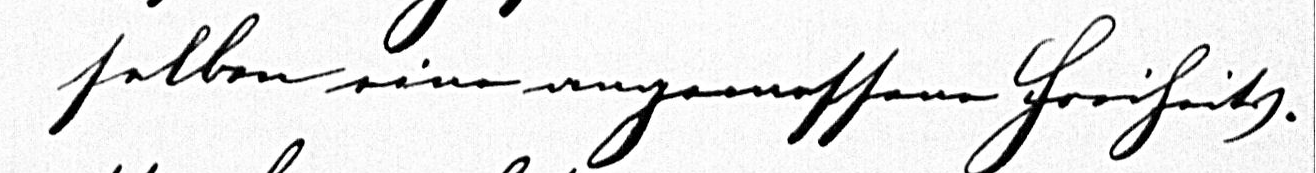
selben eine angemessene Freiheits¬
